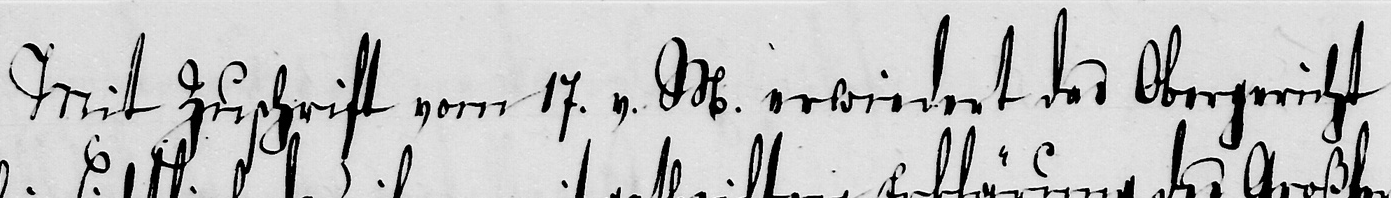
Mit Zuschrift vom 17. v. M. erwiedert das Obergericht
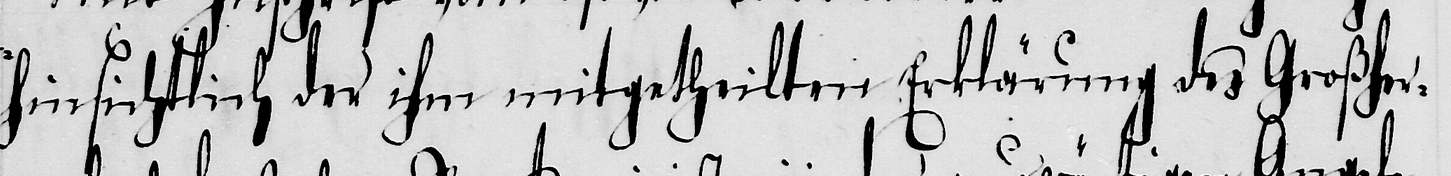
hinsichtlich der ihm mitgetheilten Erklärung des Großher¬
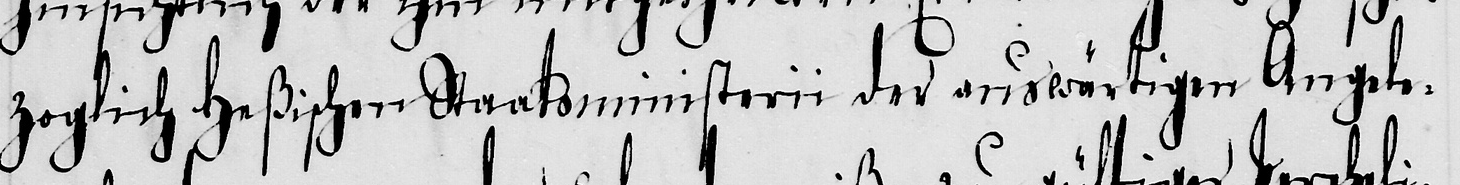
zoglich Heßischen Staatsministerii der auswärtigen Angele¬
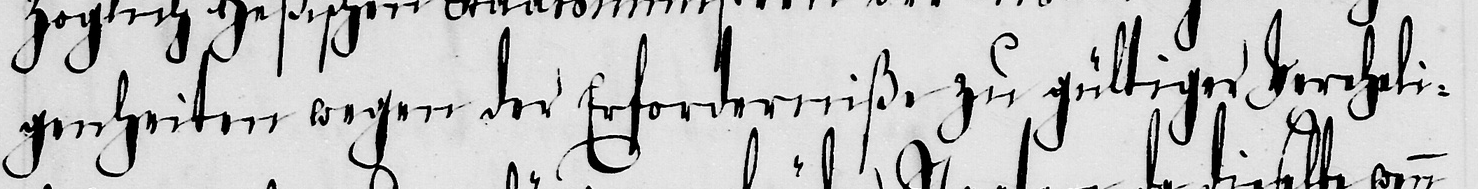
genheiten wegen der Erfoderniße zu gültiger Vereheli¬
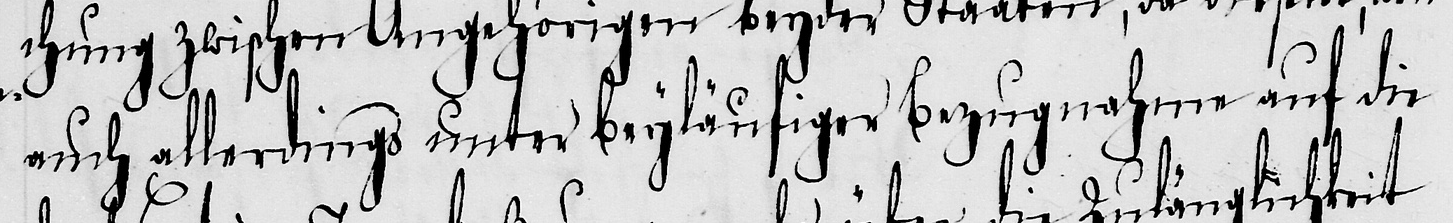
auch allerdings unter beyläufiger Bezugnahme auf die
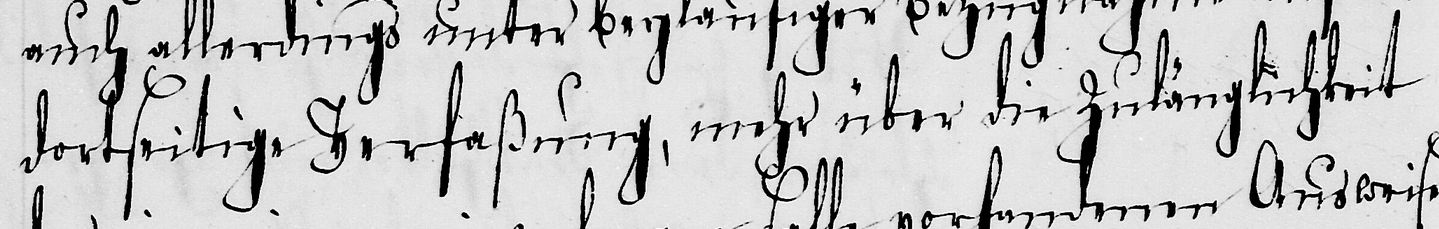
dortseitige Verfaßung, mehr über die Zulänglichkeit
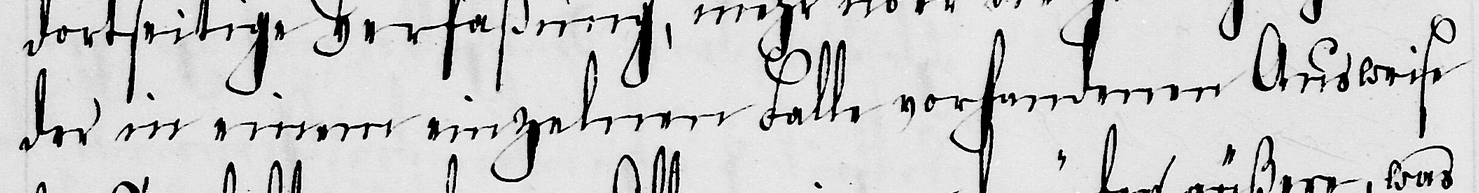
der in einem einzelnen Falle vorhandenen Ausweise
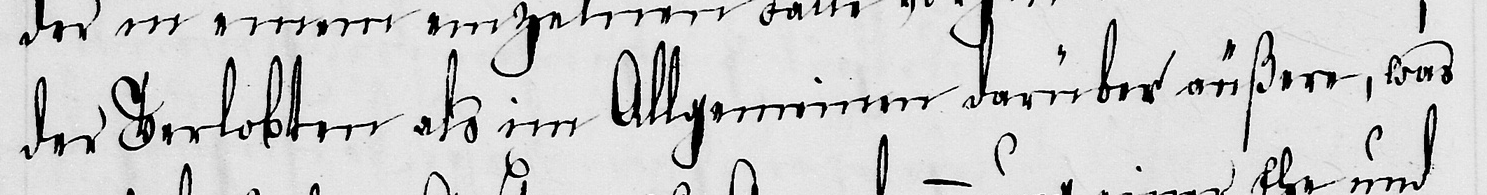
der Verlobten als im Allgemeinen darüber äußere, was
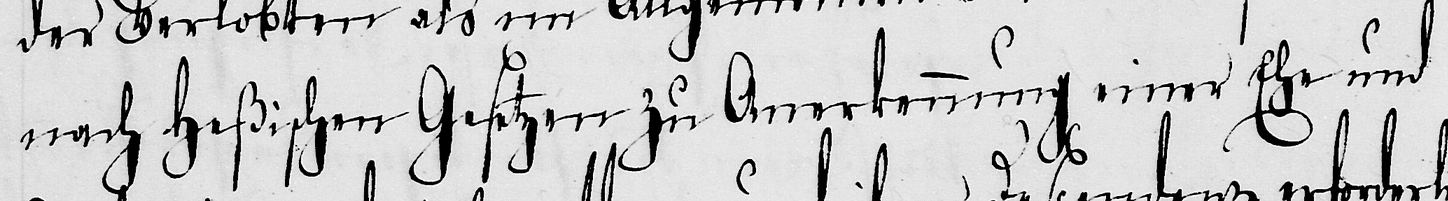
nach heßischen Gesetzen zu Anerkennung einer Ehe und
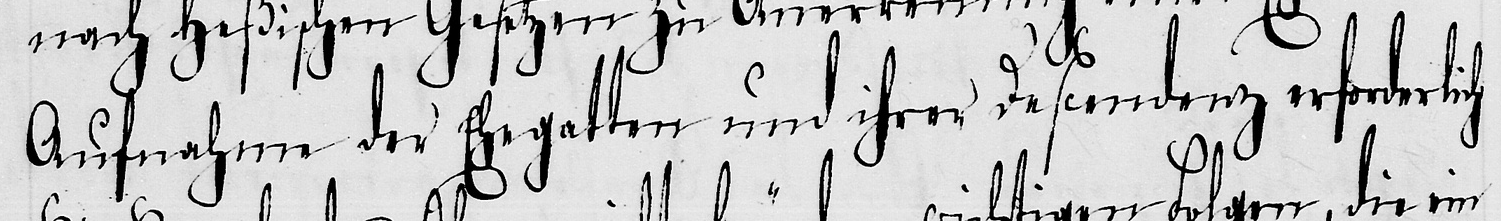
Aufnahme der Ehegatten und ihrer Descendenz erforderl¬
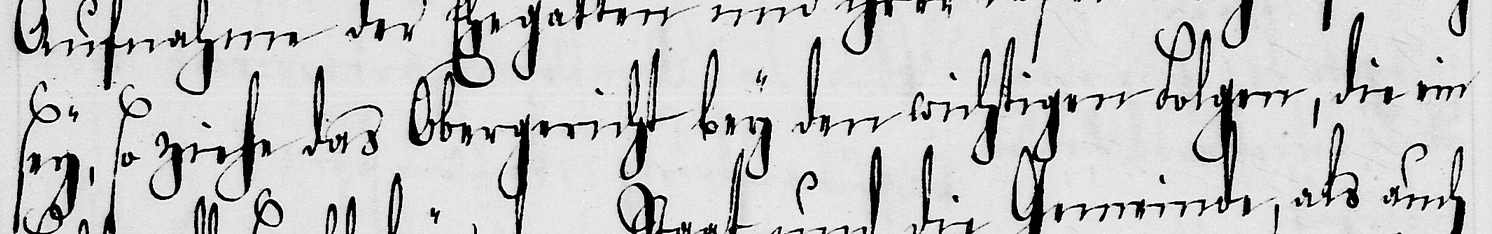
ziehe das Obergericht bey den wichtigen Folgen, die
